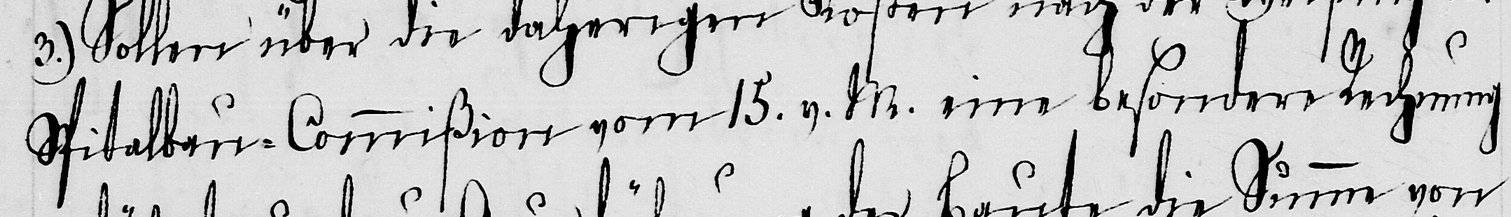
Spitalbau-Commißion vom 15. v. M. eine besondere Rechnung
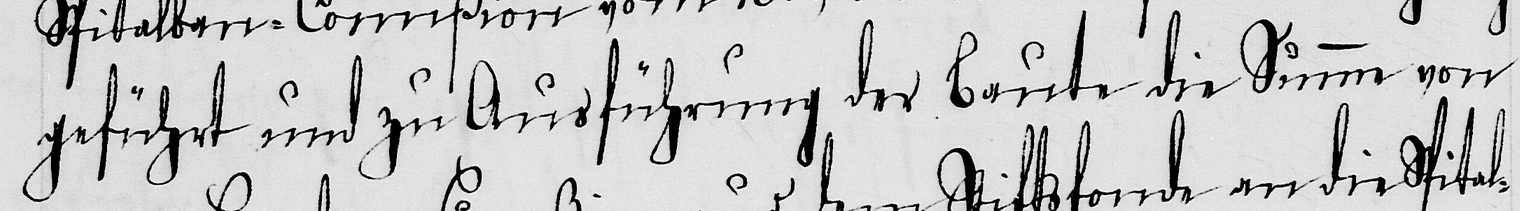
geführt und zu Ausführung der Baute die Summe von
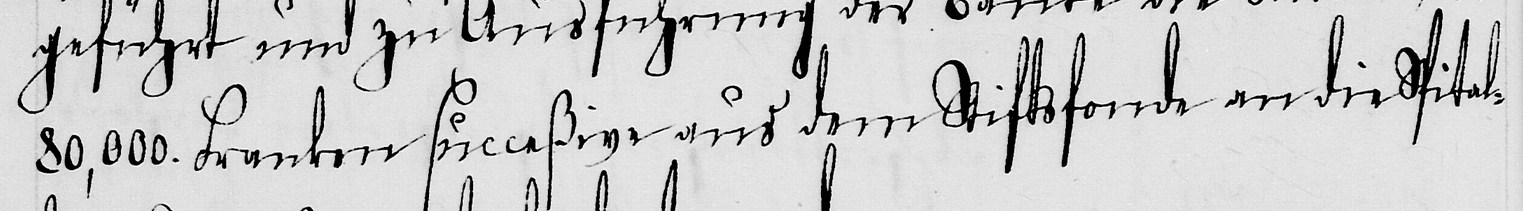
80,000 Franken succeßive aus dem Stiftsfonde an die Spita¬
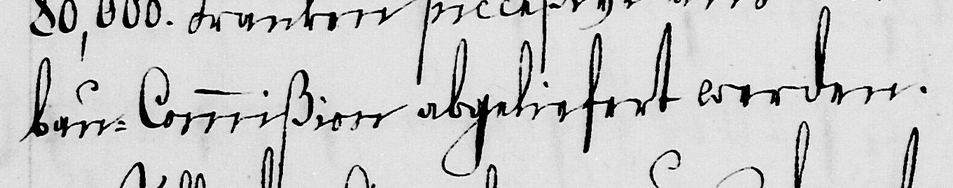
lbau-Commißion abgeliefert werden.
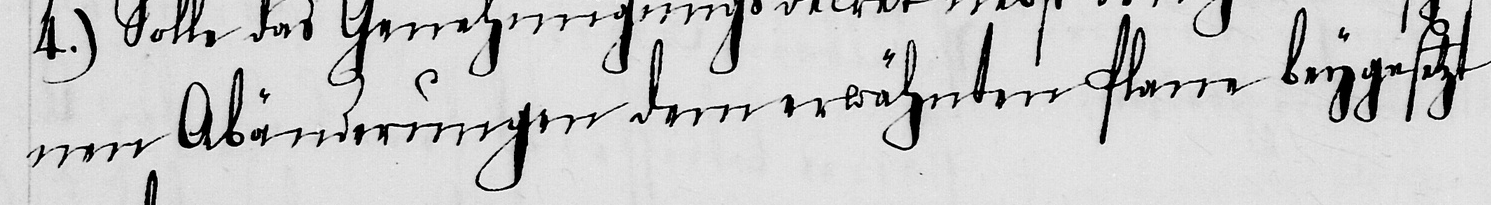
nen Abänderungen dem erwähnten Plane beygesetzt
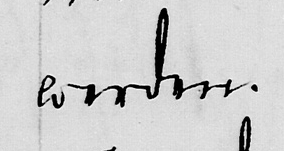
werden.
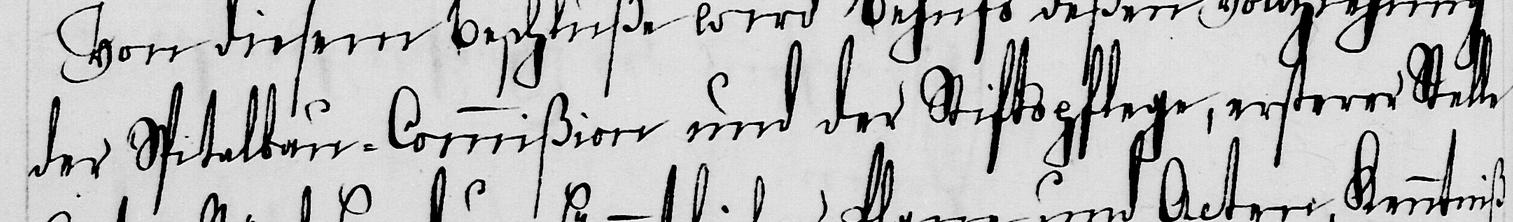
der Spitalbau-Commißion und der Stiftspflege, ersterer Ste¬
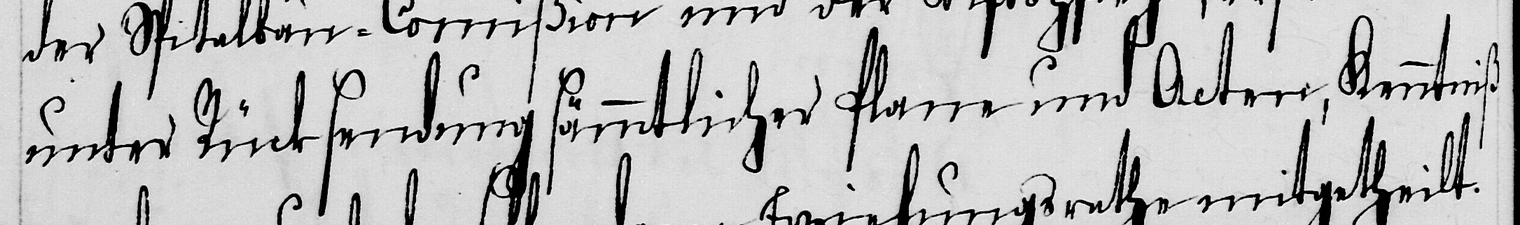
unter Rücksendung sämmtlicher Plane und Acten, Kenntniß
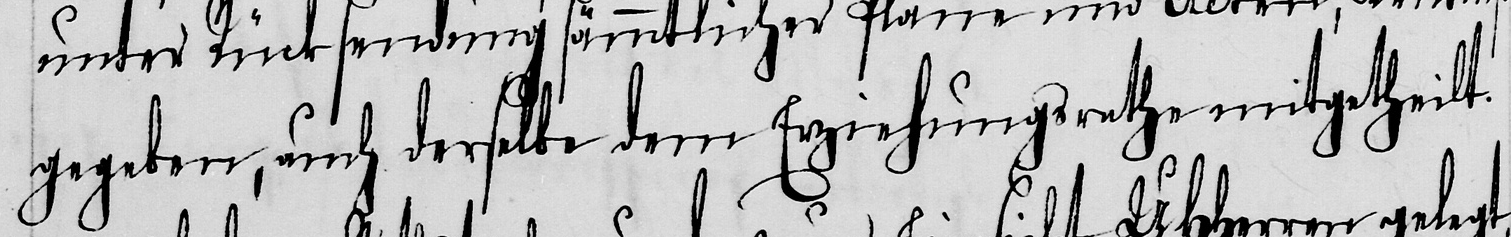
gegeben, auch derselbe dem Erziehungsrathe mitgetheil¬
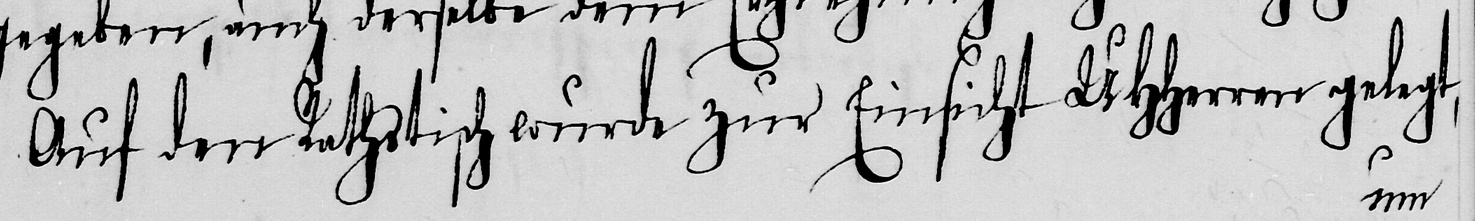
Auf den Rathstisch wurde zur Einsicht UHHerren gelegt,
